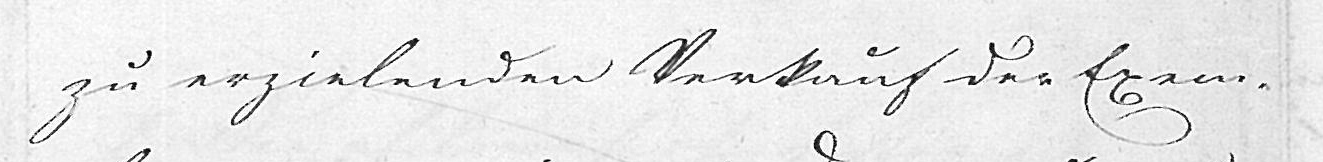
zu erzielenden Verkauf der Exem-
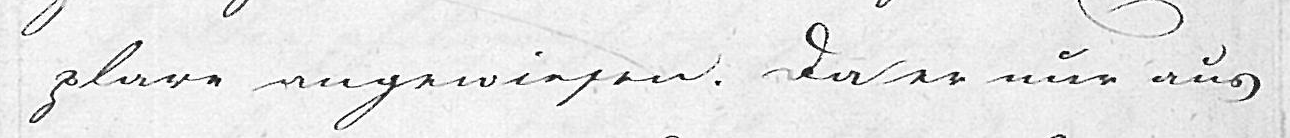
plare angewiesen. Da er nur aus
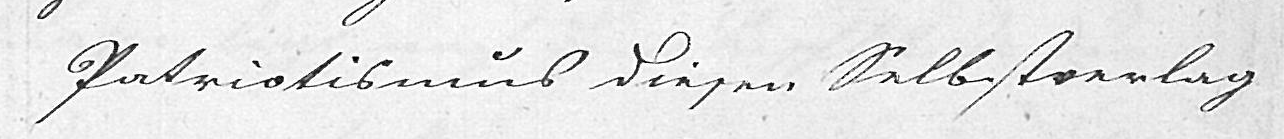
Patriotismus diesen Selbstverlag
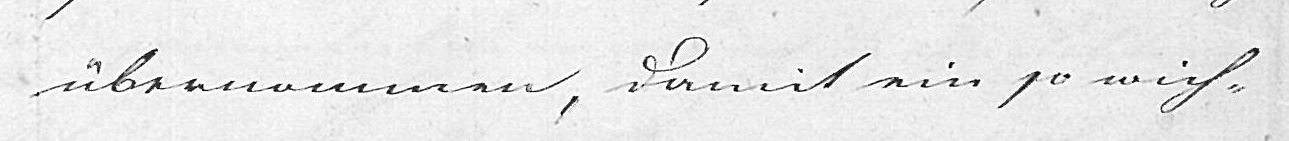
übernommen, damit ein so wich-
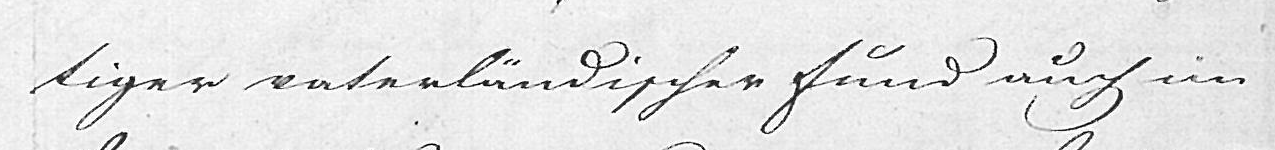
tiger vaterländischer Fund auch im
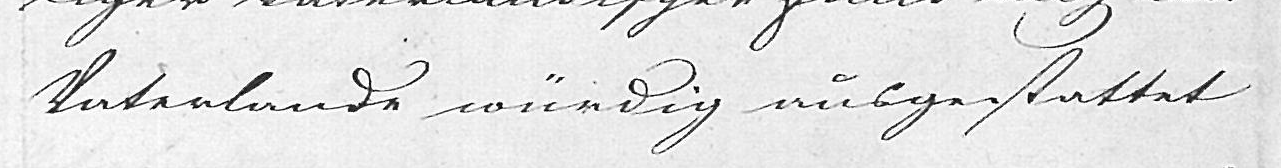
Vaterlande würdig ausgestattet
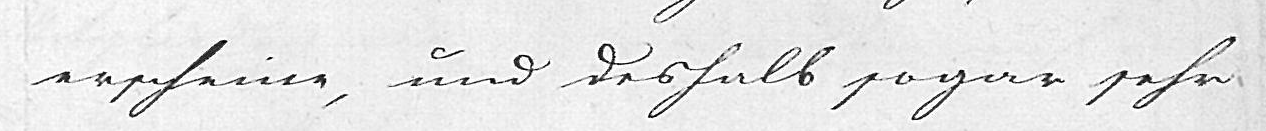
erscheine, und deshalb sogar sehr
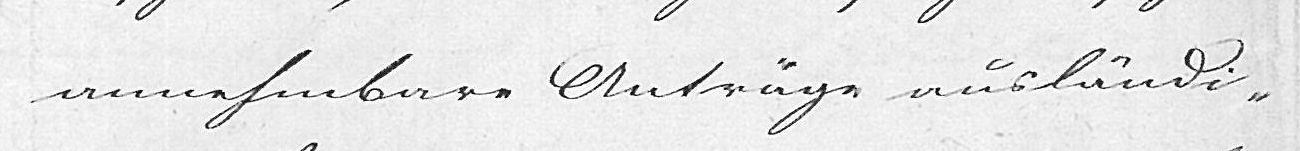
annehmbare Anträge ausländi-
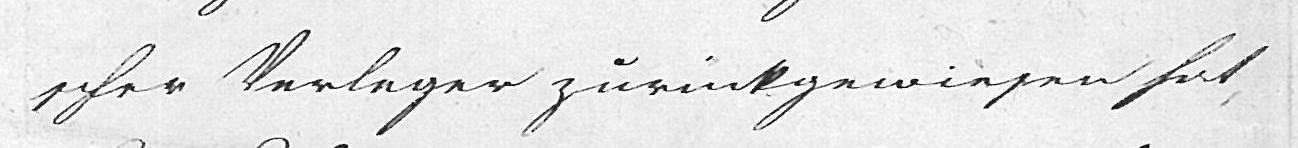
scher Verleger zurückgewiesen hat,
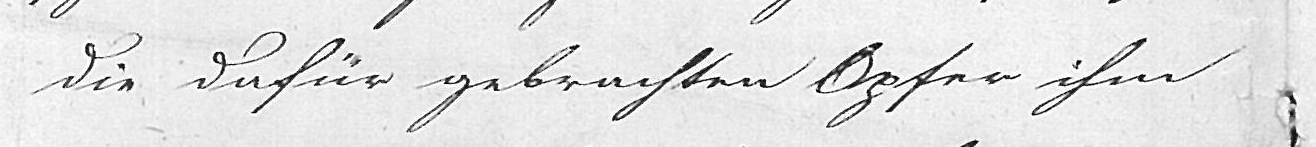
die dafür gebrachten Opfer ihm
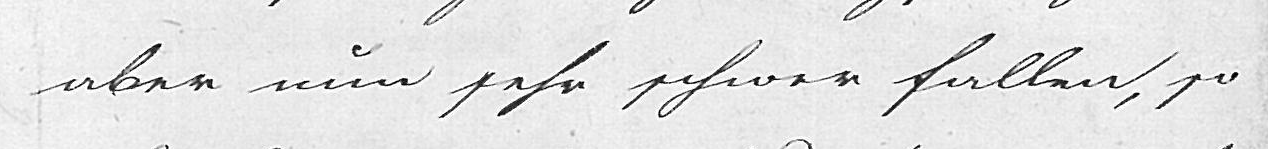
aber nun sehr schwer fallen, so
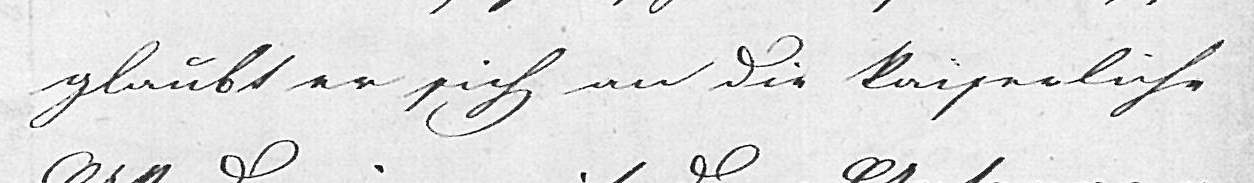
glaubt er sich an die kaiserliche
